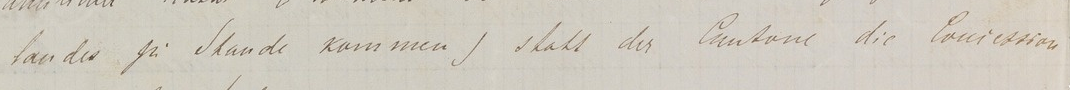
landes zu Stande kommen) statt der Cantone die Concession
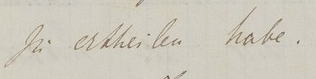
zu ertheilen habe.
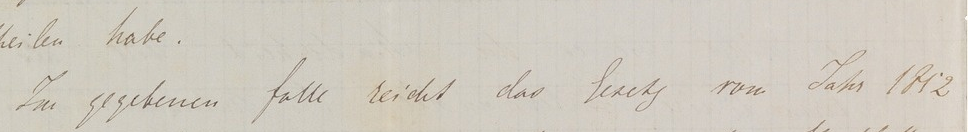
Im gegebenen Falle reicht das Gesetz vom Jahr 1852
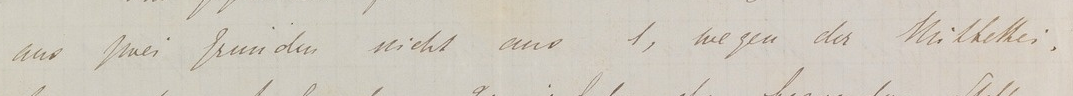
aus zwei Gründen nicht aus 1) wegen der Mitbethei-
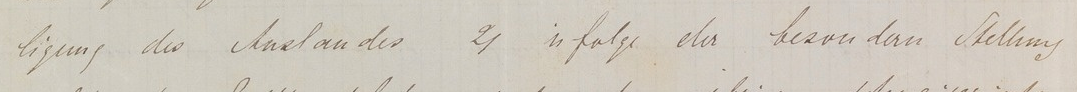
ligung des Auslandes 2) infolge der besondern Stellung
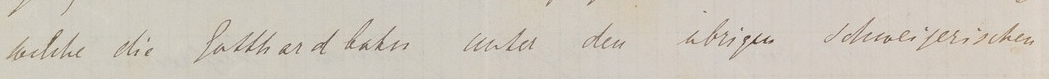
welche die Gotthardbahn unter den übrigen schweizerischen
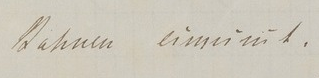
Bahnen einnimmt.
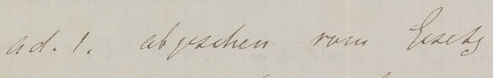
ad. 1. abgesehen vom Gesetz
